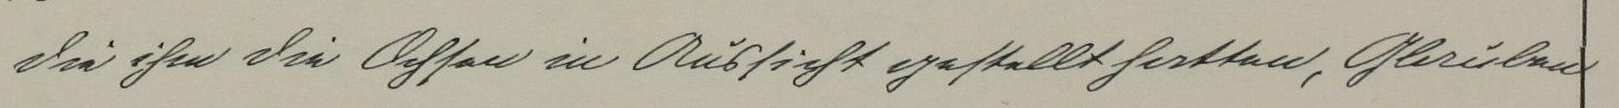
die ihm die Ochsen in Aussicht gestellt hatten, Glauben
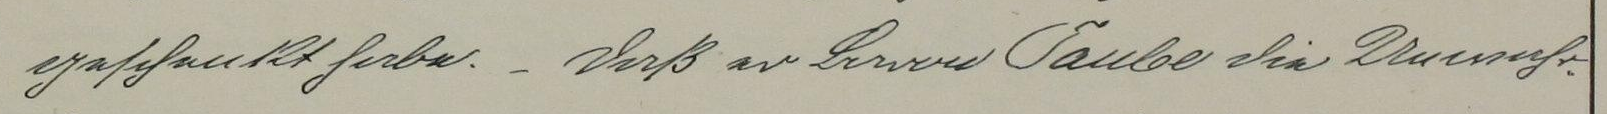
geschenkt habe. Daß er Baron Taube die Unwahr-
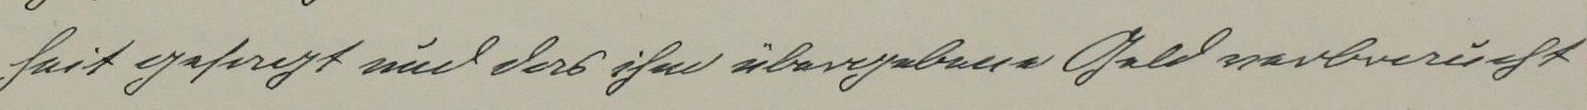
heit gesagt und das ihm übergebene Geld verbraucht
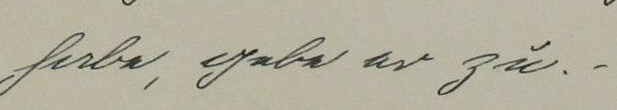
habe, gebe er zu.
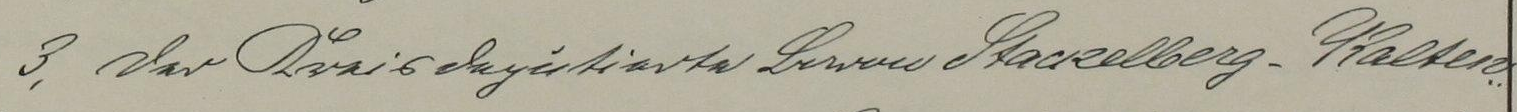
3. Der Kreisdeputierte Baron Stackelberg-Kalten-
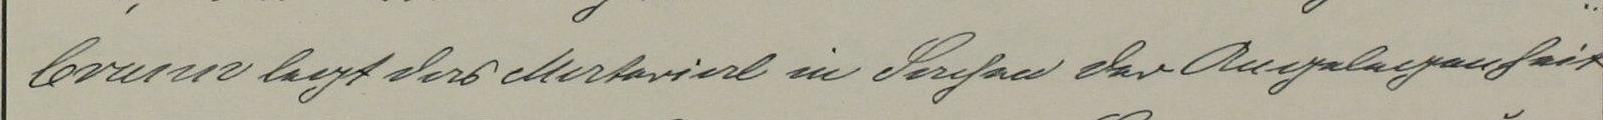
brunn legt das Material in Sachen der Angelegenheit
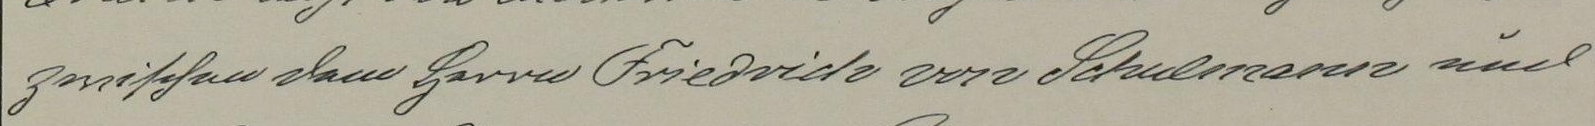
zwischen dem Herrn Friedrich von Schulmann und
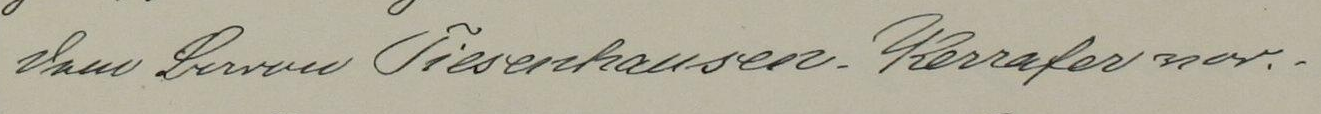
dem Baron Tiesenhausen-Kerrafer vor.
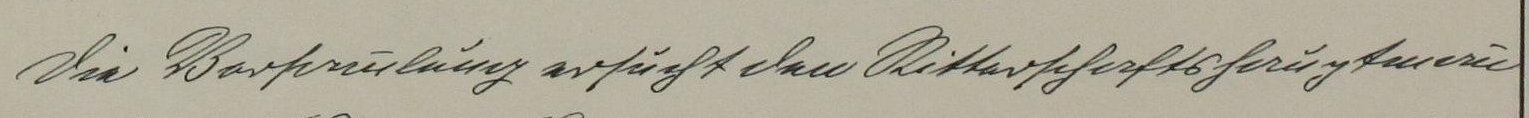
Die Versammlung ersucht den Ritterschaftshauptmann
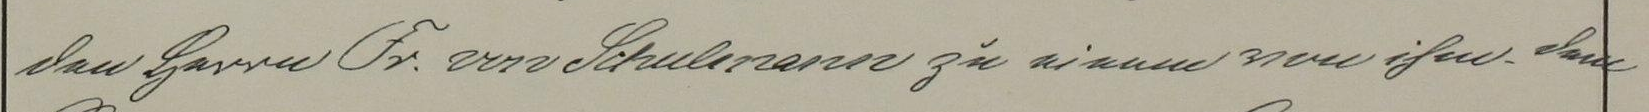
den Herrn Fr. von Schulmann zu einem von ihm, dem
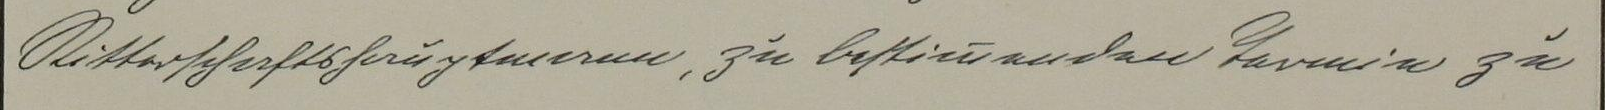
Ritterschaftshauptmann, zu bestimmenden Termin zu
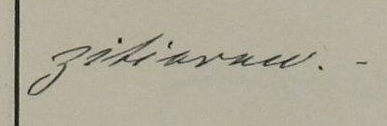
zitieren.
